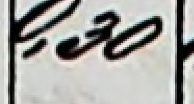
0,30
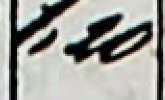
1,20
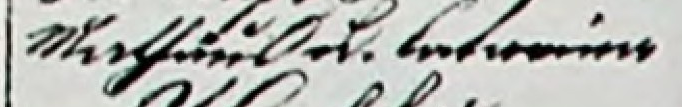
Mathäus u. Catarina
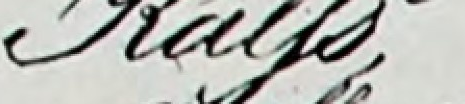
Kalss,
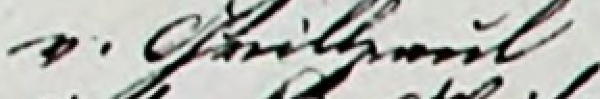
v. Greillpaul
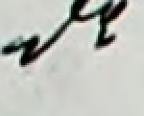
Do
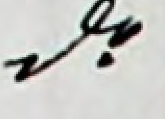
Do
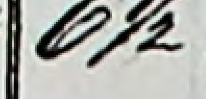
6 1/2
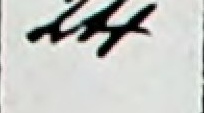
24
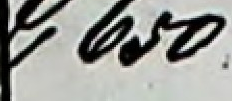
0,650
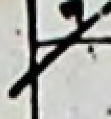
7
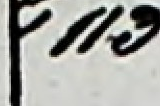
0,113
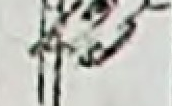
125
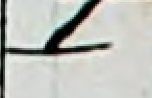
I
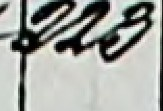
223
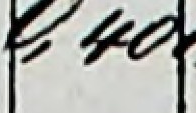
0,40
